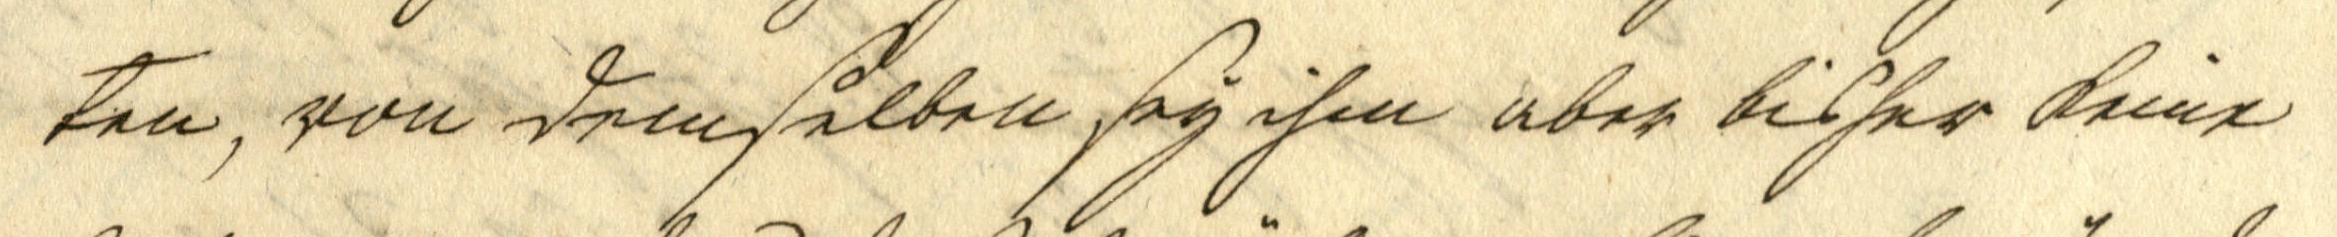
ten, von demselben sey ihm aber bisher keine
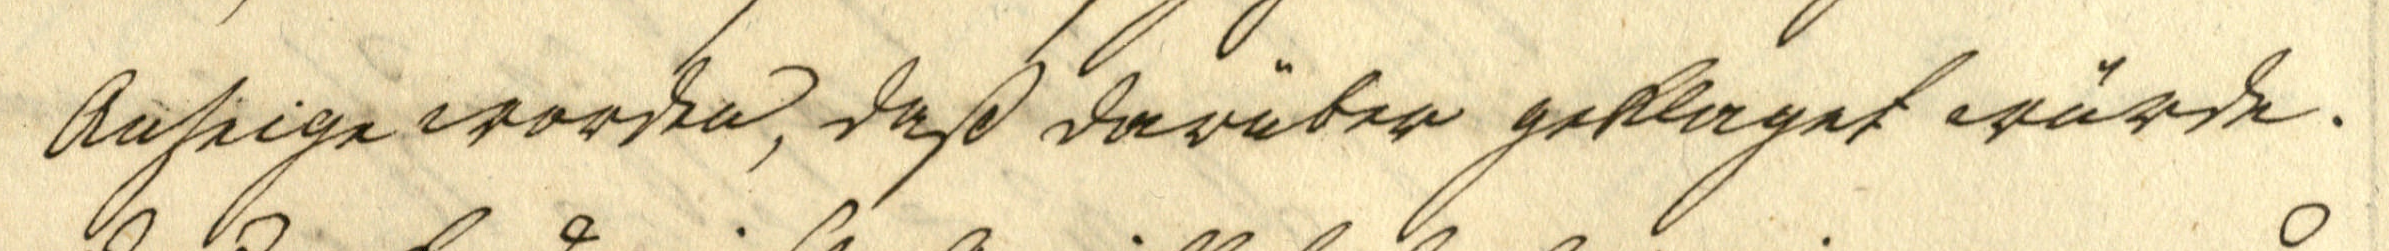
Anzeige worden, daß darüber geklaget würde.
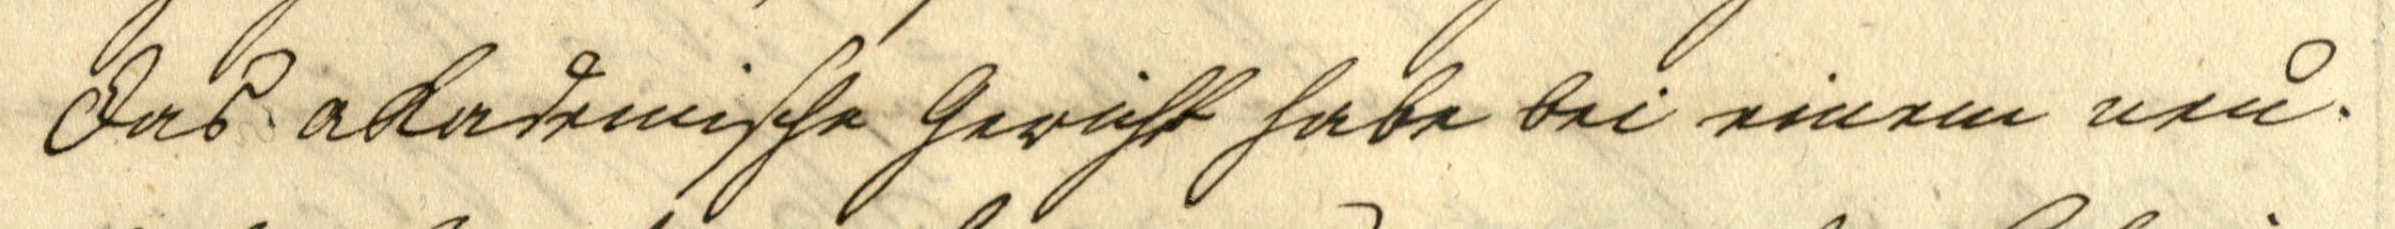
Das akademische Gericht habe bei einem neu-
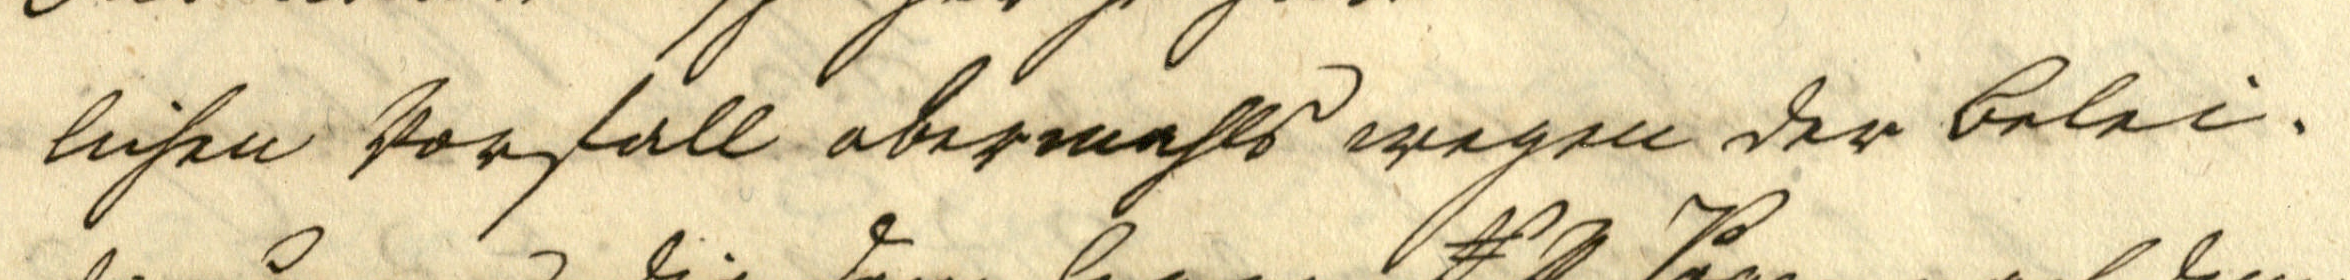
lichen Vorfall abermahls wegen der Belei-
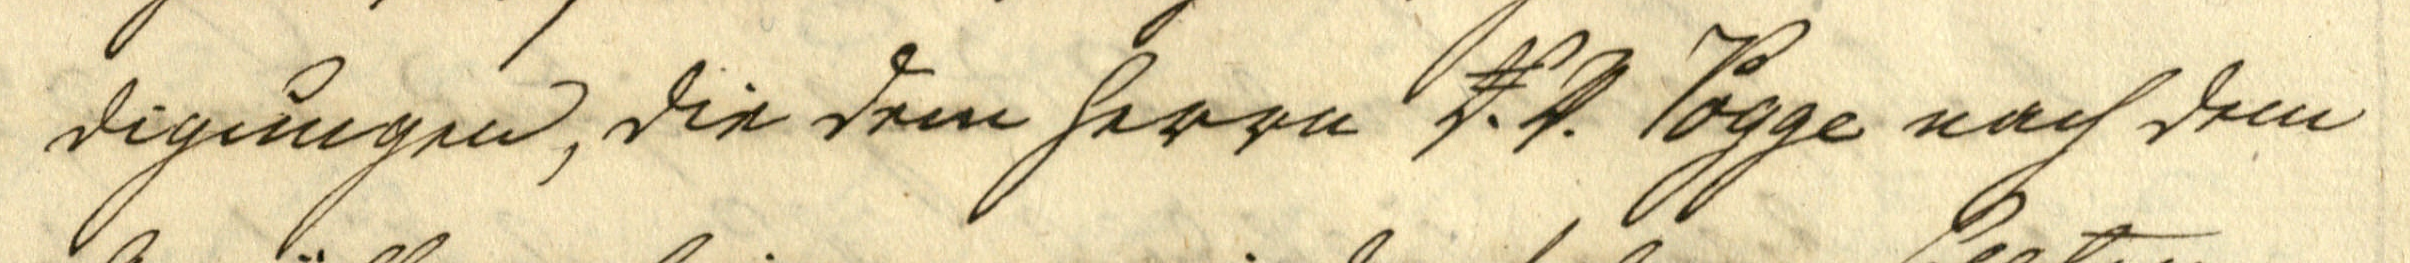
digugnen, die dem Herrn R. V. Pogge nach dem
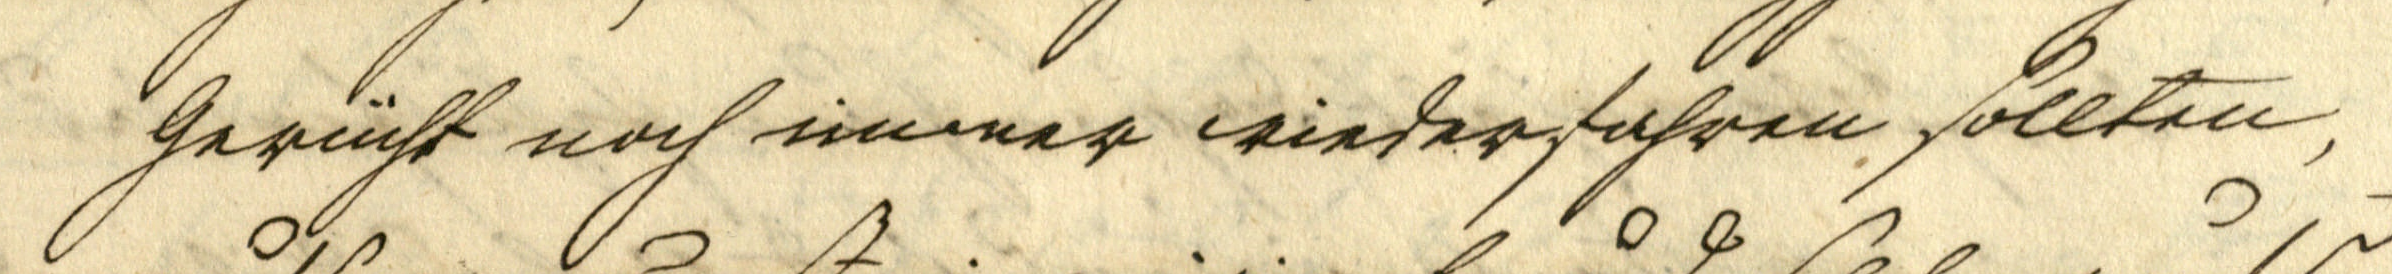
Gerücht noch immer wiederfahren sollten,
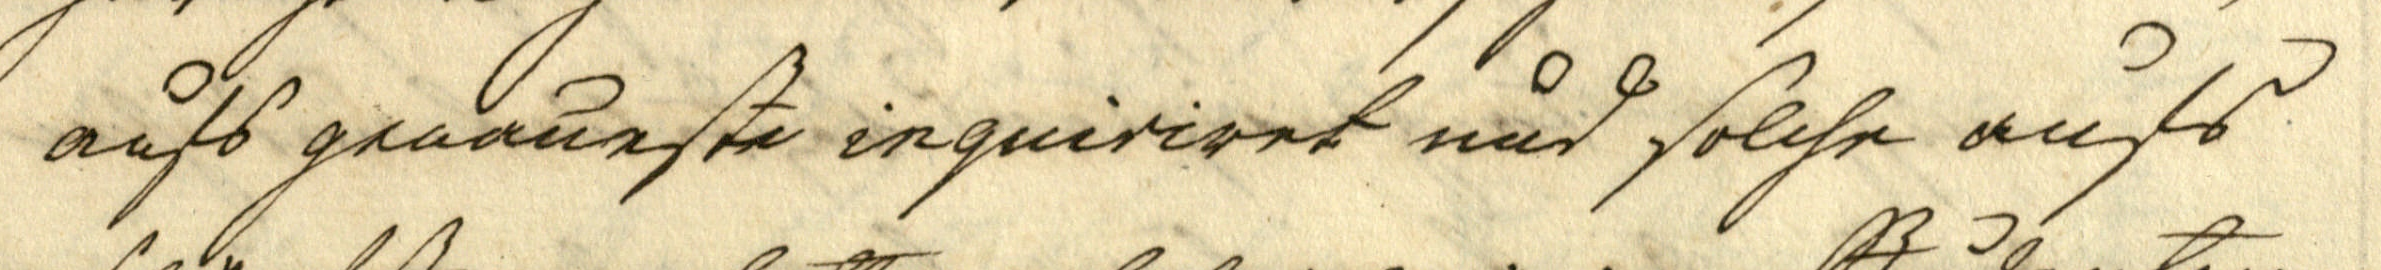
aufs genaueste inquiriret und solche aufs
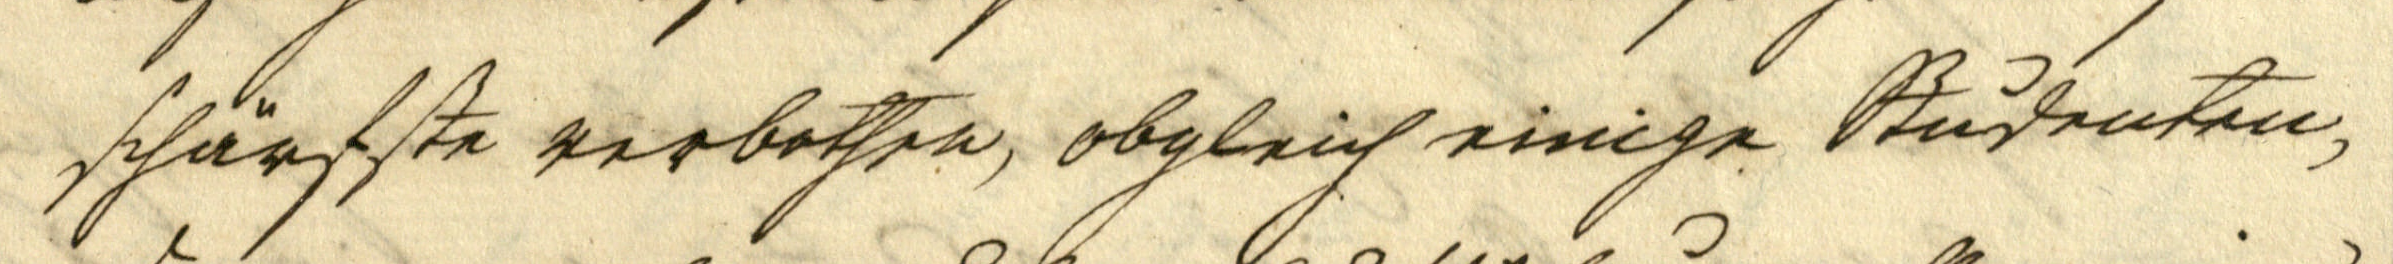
schärfste verbothen, obgleich einige Studenten,
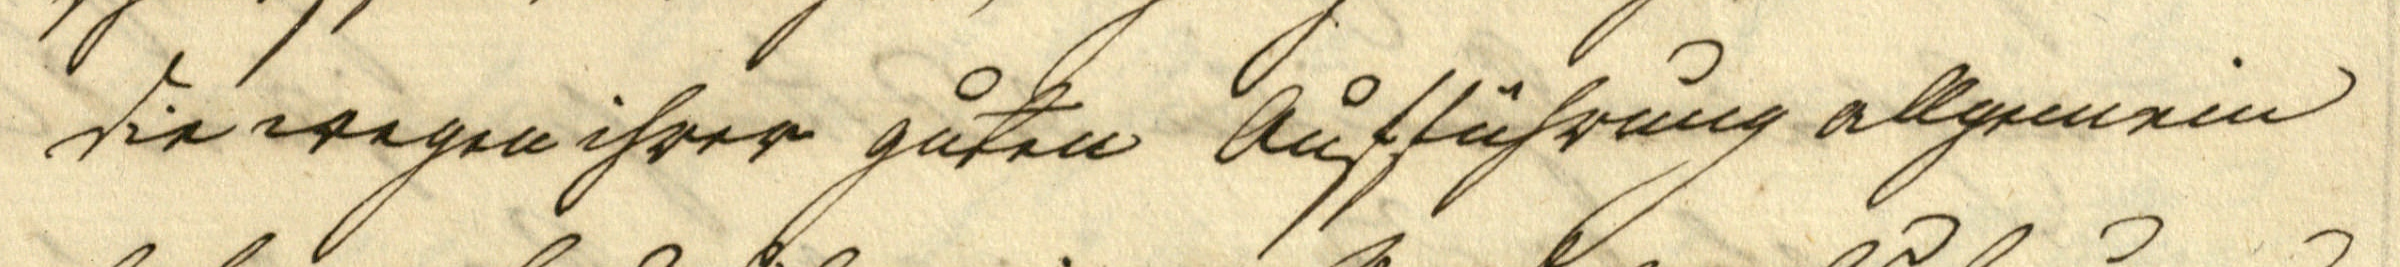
die wegen ihrer guten Aufführung allgemein
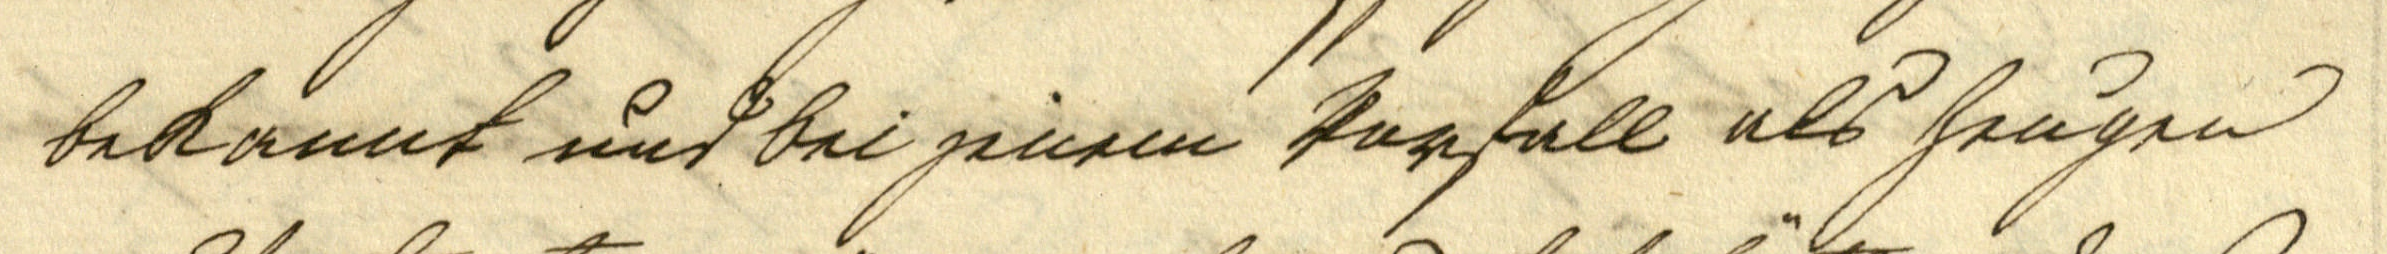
bekannt und bei jenem Vorfall als Zeugen
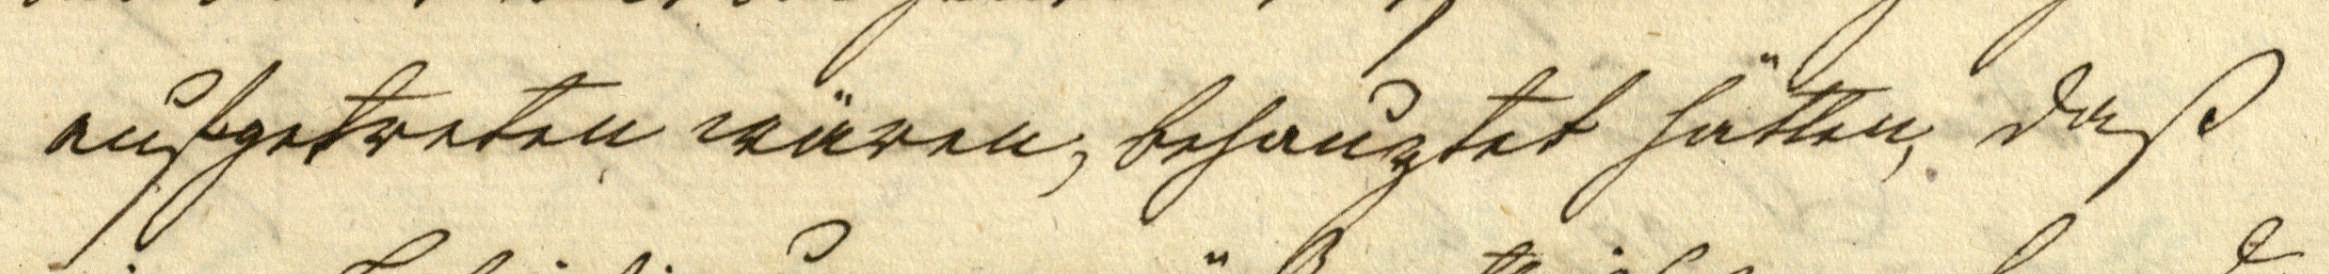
aufgetreten wären, behauptet hätten, daß
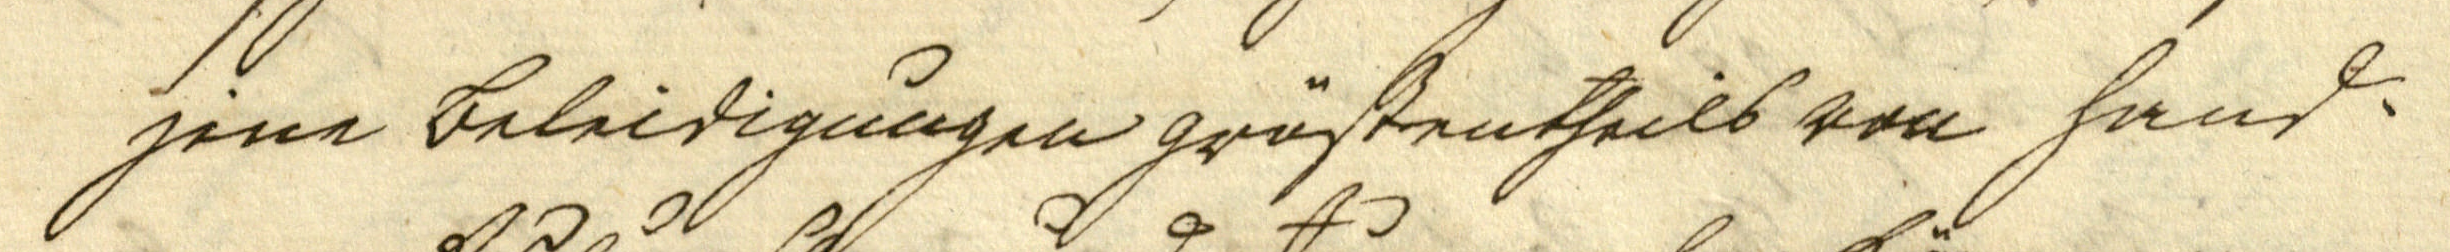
jene Beleidungen größtentehils von Hand-
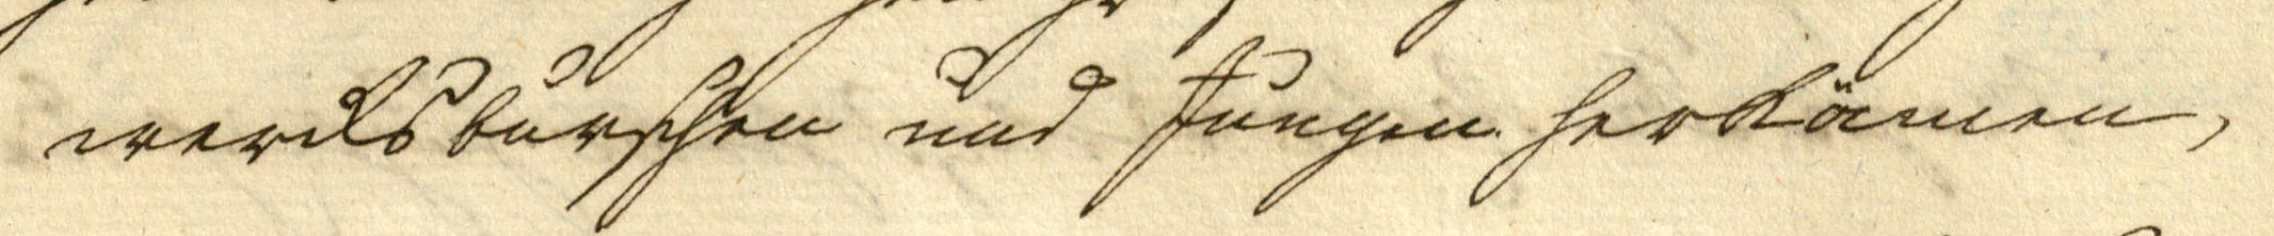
werksburschen und Jungen herkämen,
